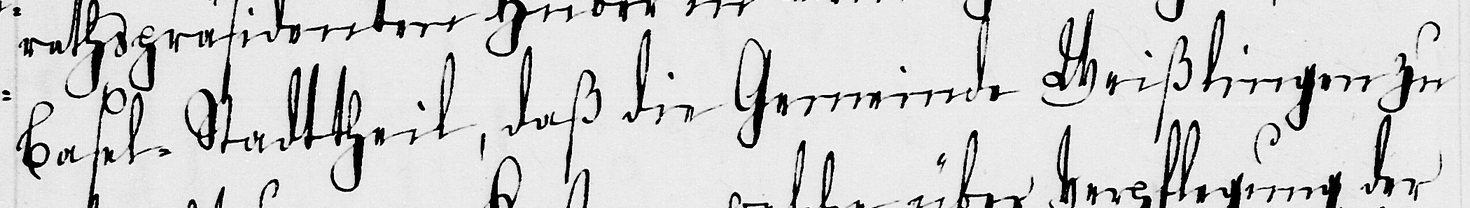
Basel-Stadttheil, daß die Gemeinde Weißlingen zu
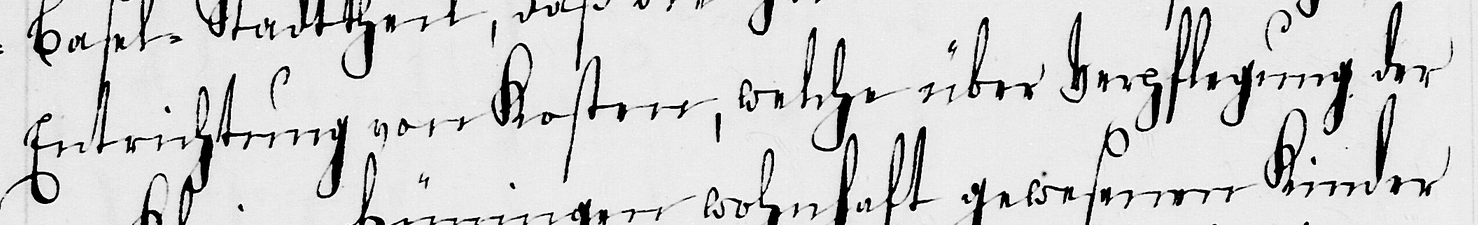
Entrichtung von Kosten, welche über Verpflegung der
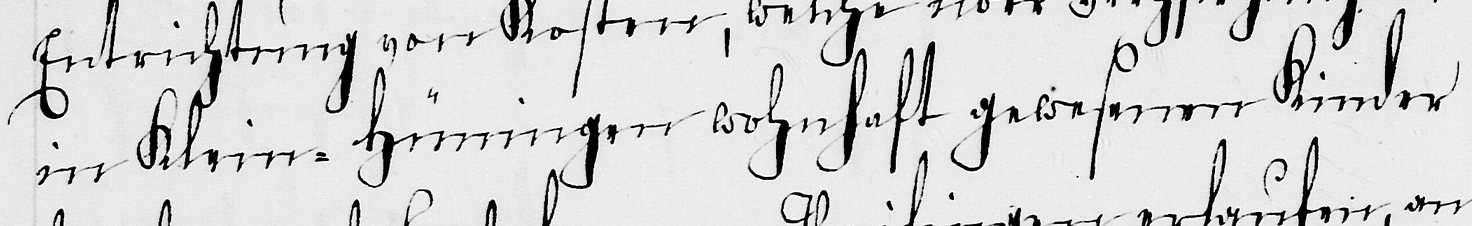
in Klein-Hüningen wohnhaft gewesenen Kinder
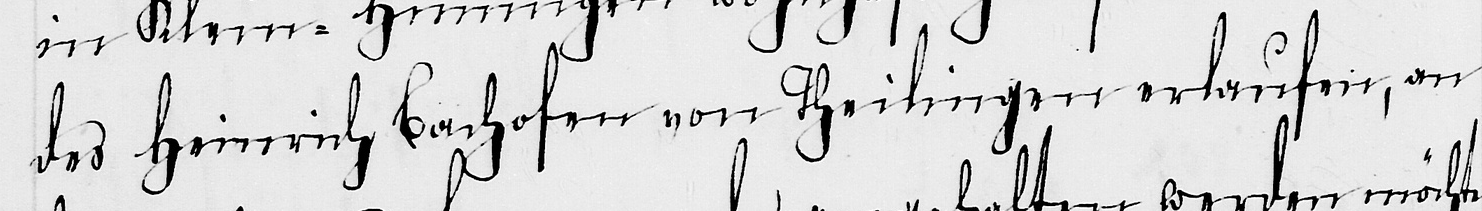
des Heinrich Bachofen von Theilingen erlaufen, an
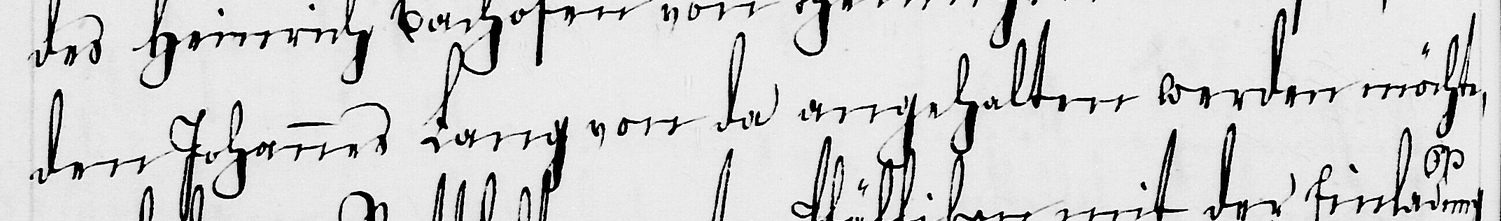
den Johannes Lang von da angehalten werden möcht¬
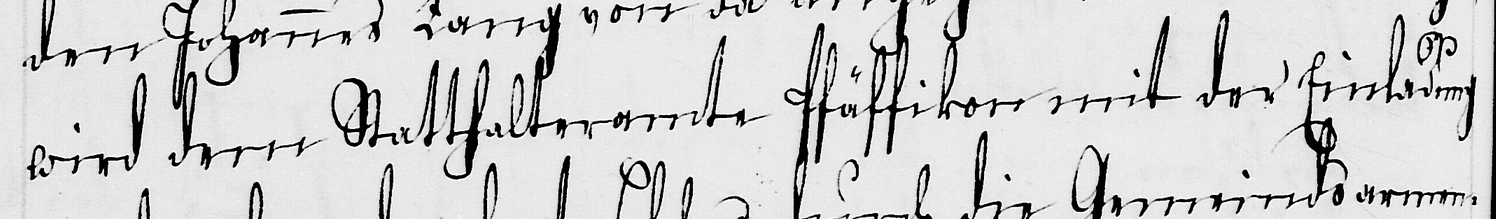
wird dem Statthalteramte Pfäffikon mit der Einladung
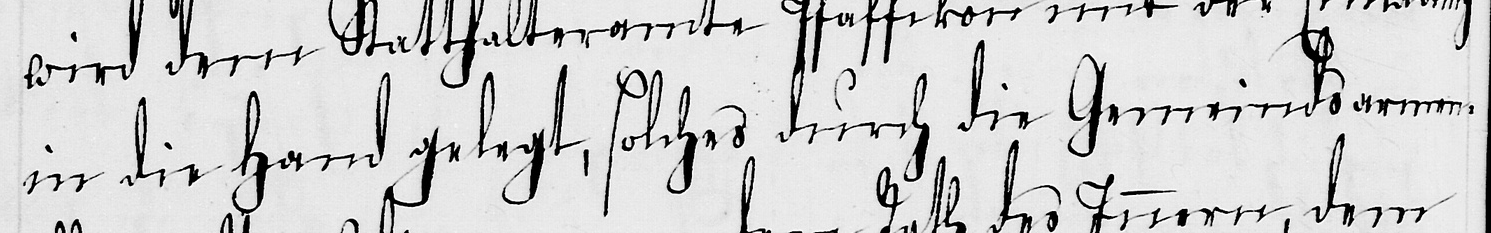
in die Hand gelegt, solches durch die Gemeindsarmen¬
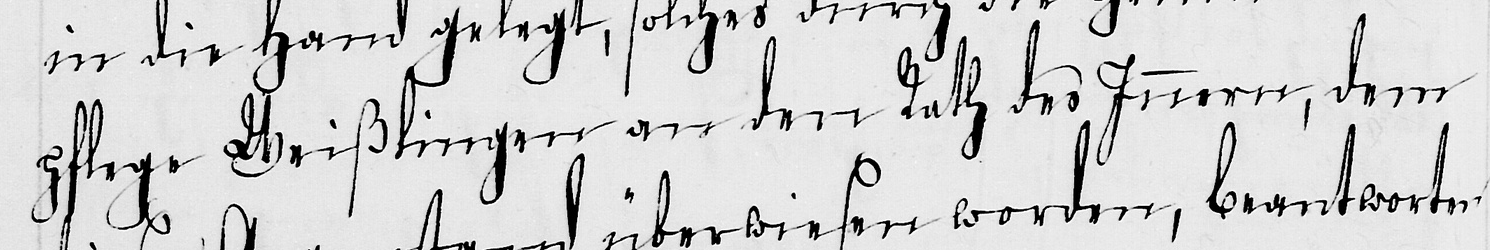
pflege Weißlingen an den Rath des Innern, dem
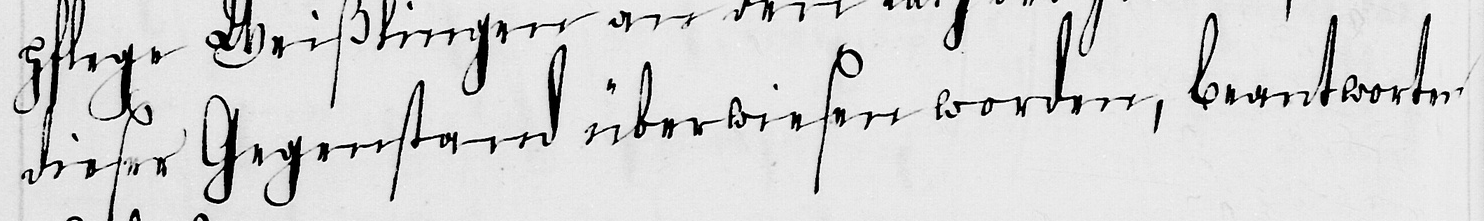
dieser Gegenstand überwiesen worden, beantworten
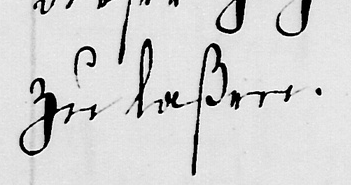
zu laßen.
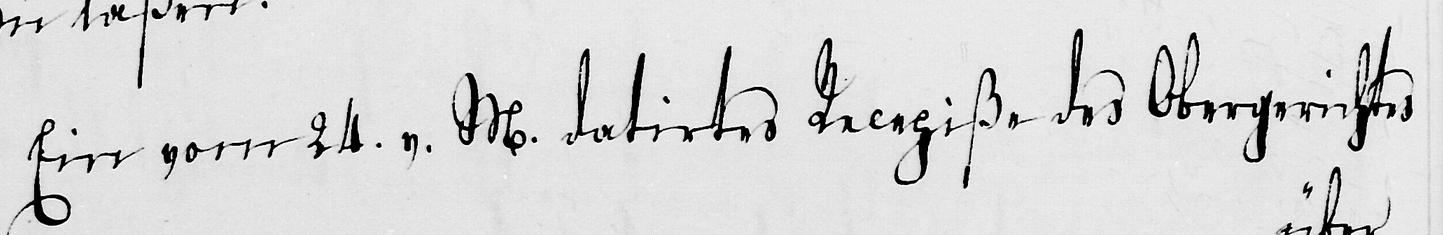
Ein vom 24. v. M. datirtes Recepiße des Obergerichtes
